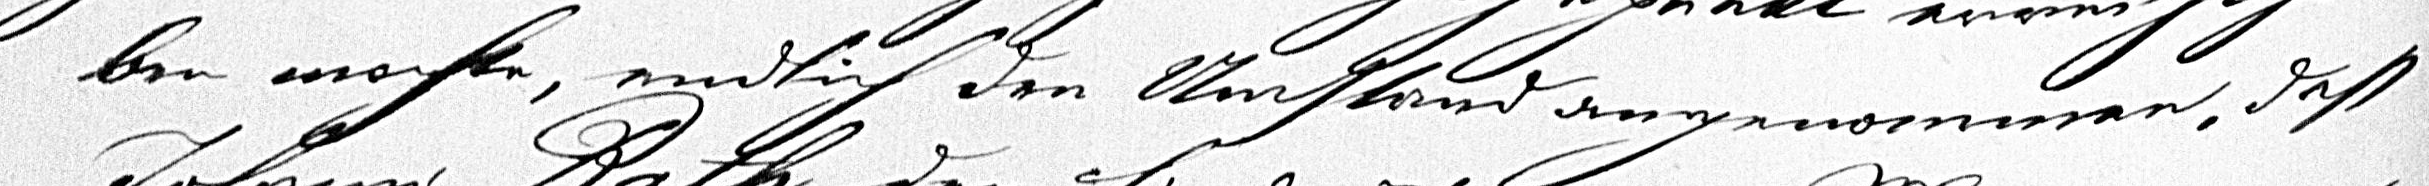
ben mochte, endlich den Umstand angenommen, daß
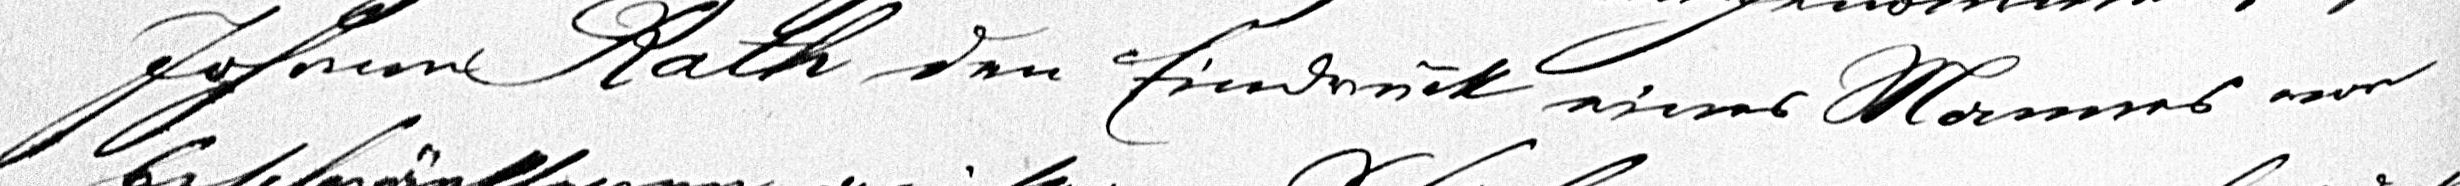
Johann Rath den Eindruck eines Mannes von
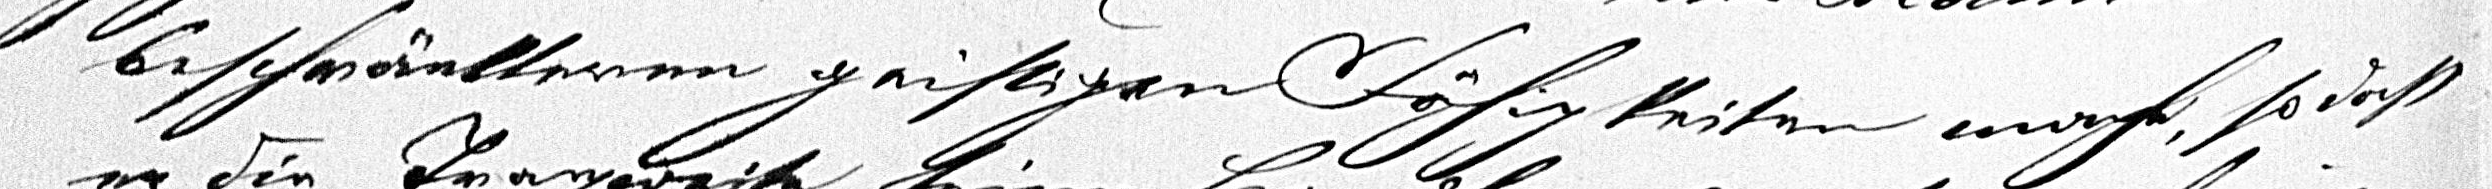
beschränxxeren geistigen Fähigkeiten mache, so daß
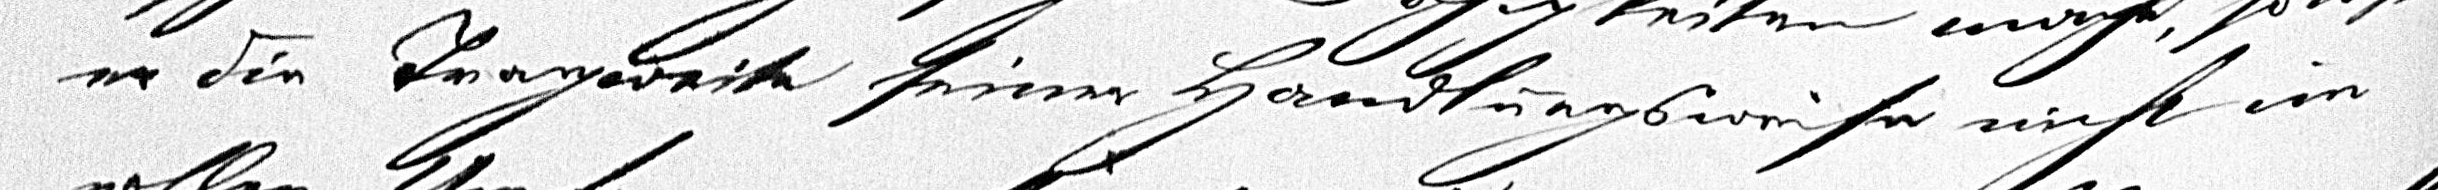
er die Tragweite seiner Handlungsweise nicht im
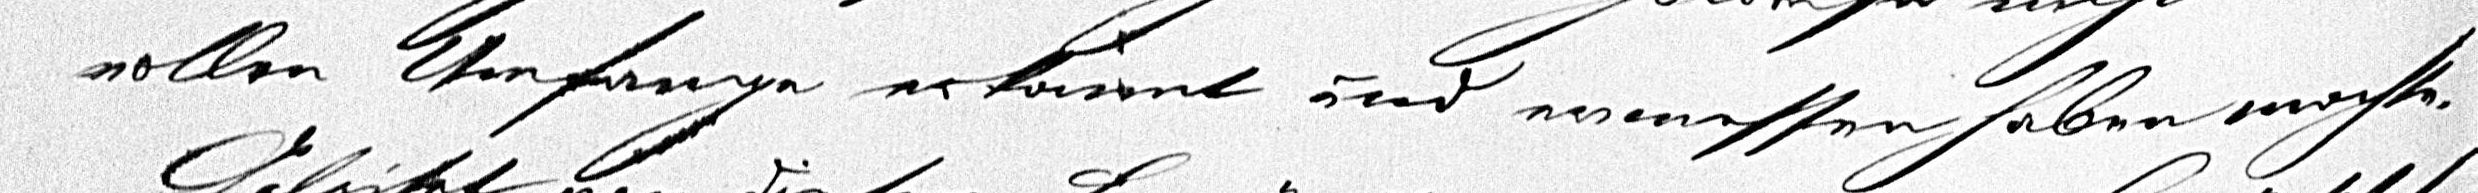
vollen Umfange erkannt und ermessen haben mochte.
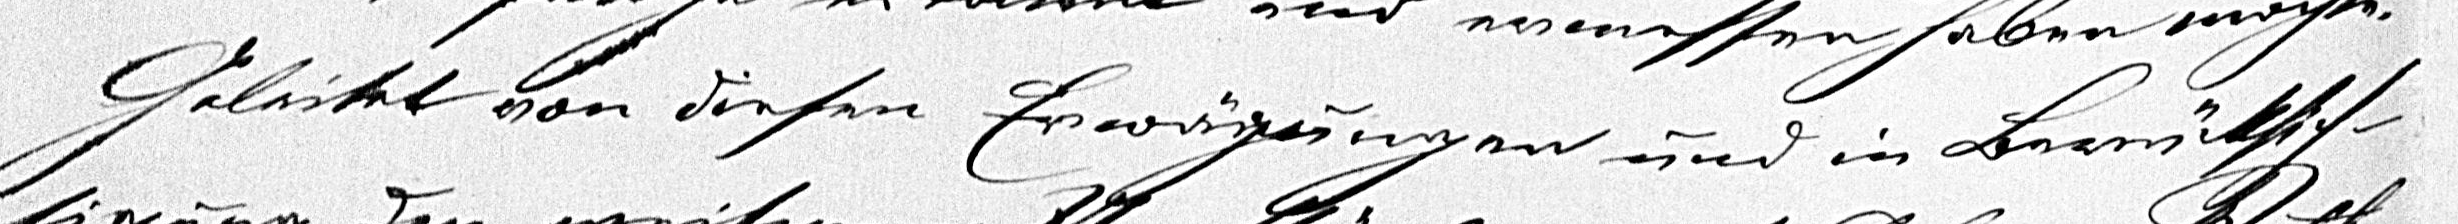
Geleitet von diesen Erwägungen und in Berücksich¬
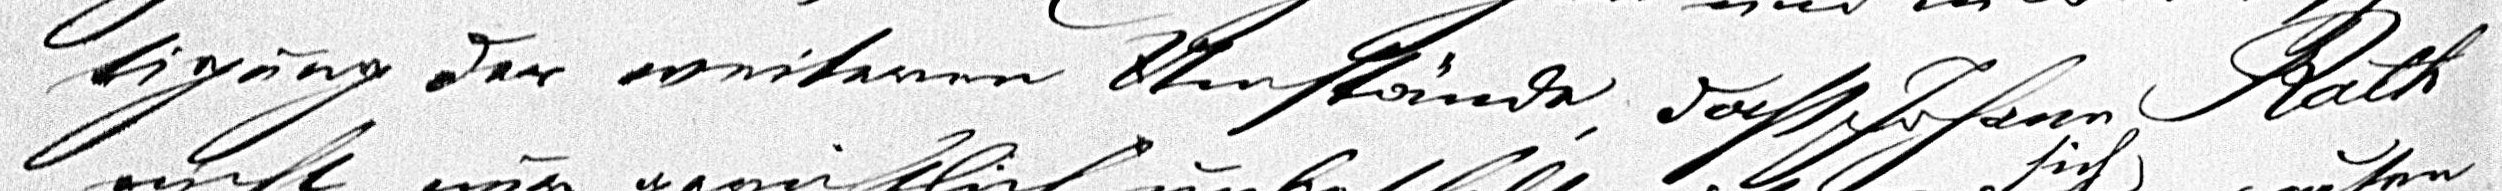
tigung der weiteren Umstände, daß Johann Rath
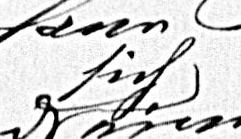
sich
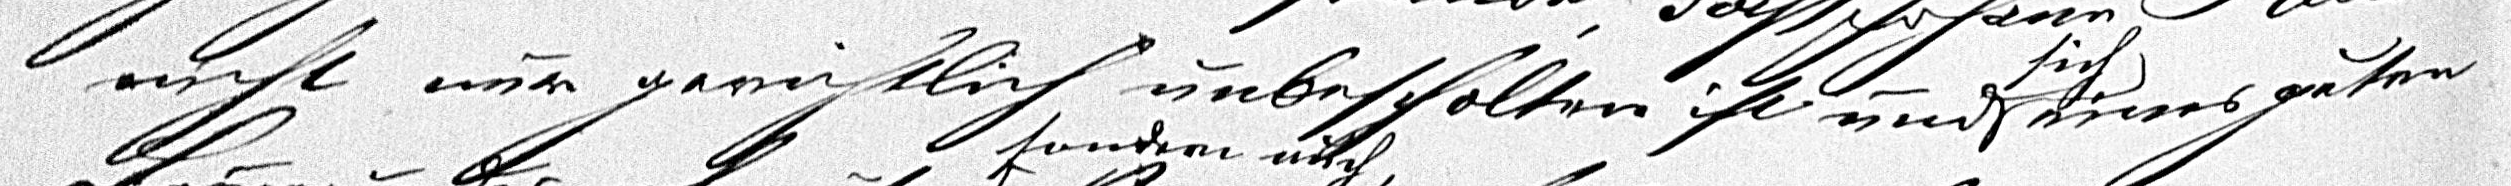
nicht nur gerichtlich unbescholten ist und eines guten
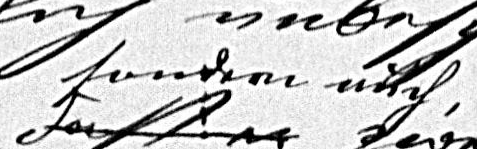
sondern auch,
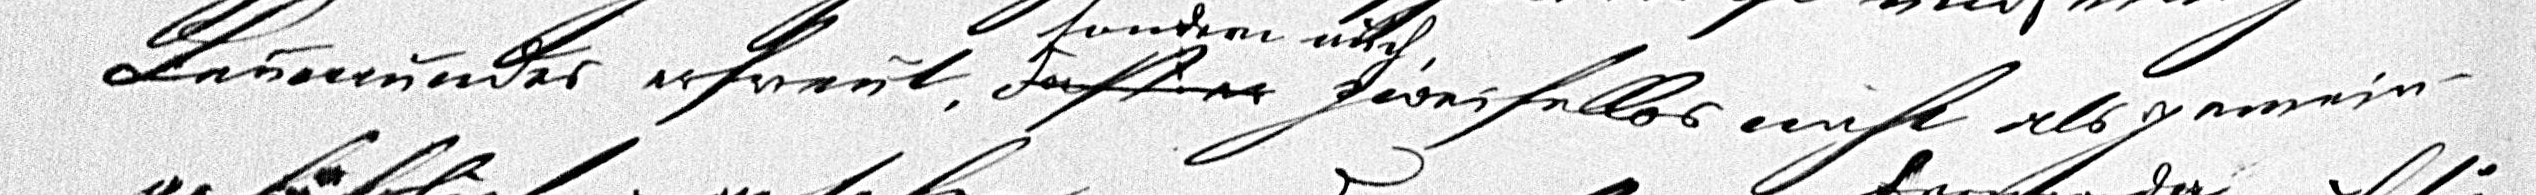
Leumundes erfreut, Zweifellos nicht als gemein¬
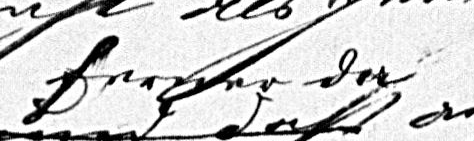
ferner da
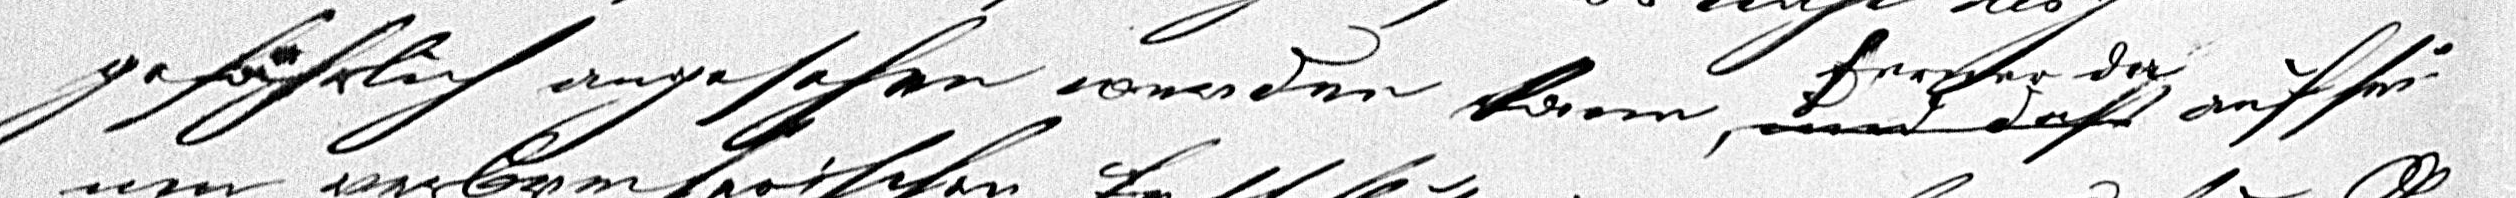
gefährlich angesehen werden kann, auf sei¬
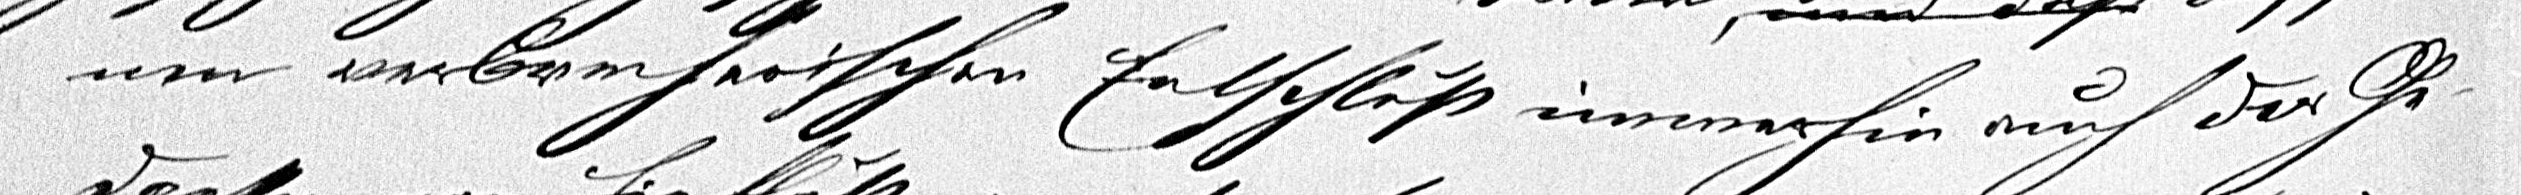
nen verbrecherischen Entschluß immerhin auch der Ge¬
